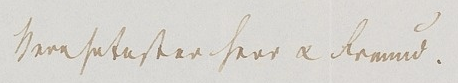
Verehrtester Herr & Freund
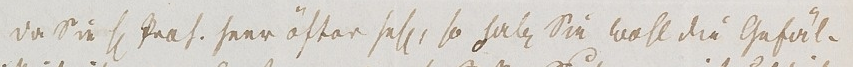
Da Sie Hr Prof. Heer öfter sehen, so haben Sie wohl die Gefäl-
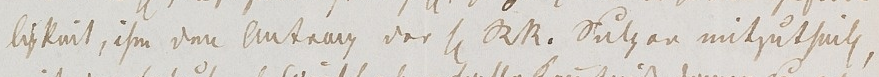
ligkeit, ihm den Antrag des Hr RR. Sulzer mitzutheilen,
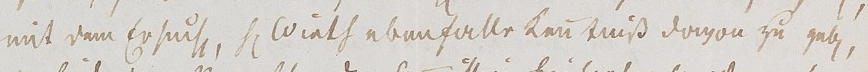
mit dem Ersuchen, Hr Wirth ebenfalls Kenntniß davon zu geben,
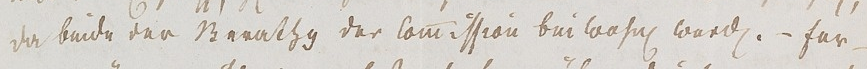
da beide der Berathg der Commission beiwohnen werden. – Fer-
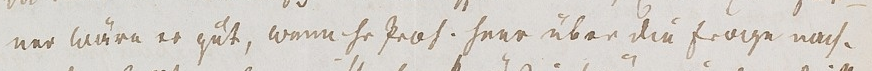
ner wäre es gut, wenn Hr Prof. Heer über die Frage nach-
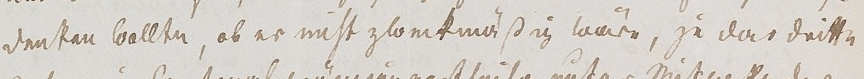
denken wollte, ob es nicht zweckmässig wäre, je das dritte
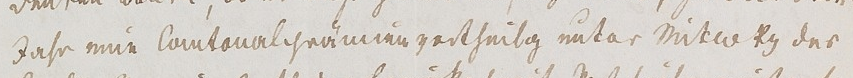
Jahr eine Cantonalprämienvertheilg unter Mitwkg des
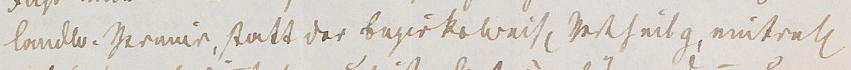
landw. Vereins, statt der bezirksweisen Vertheilg, eintreten
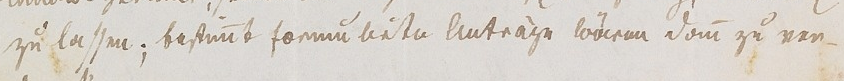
zu lassen; bestimmt formulierte Anträge wären dann zu ver-
